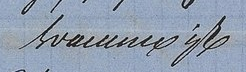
kommen ist.
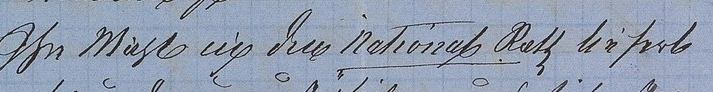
Ihre Wahl in den National Rath liefert
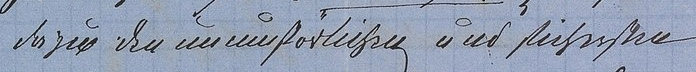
dazu den unumstöslichen und sichersten
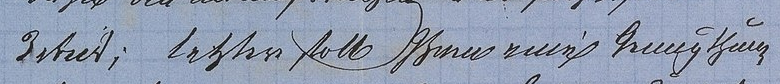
Beweis; letzter soll Ihnen eine Genugthuung
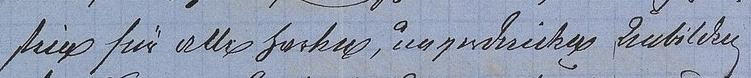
sein für alle harten, unverdienten Unbilden
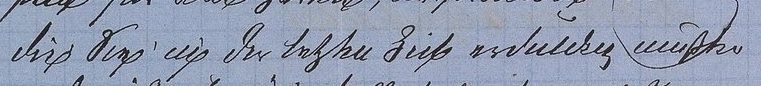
die Sie in der letzten Zeit erdulden mußten
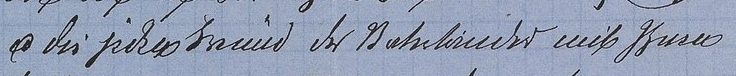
& die jeden Freund des Vaterlandes mit Ihnen
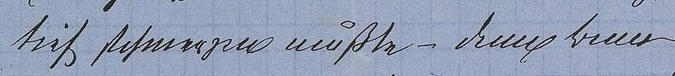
tief schmerzen mußte – denn wenn
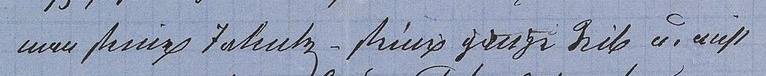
man seine Talente – seine ganze Zeit u. nicht
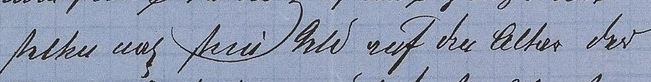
selten noch sein Geld auf den Altar des
